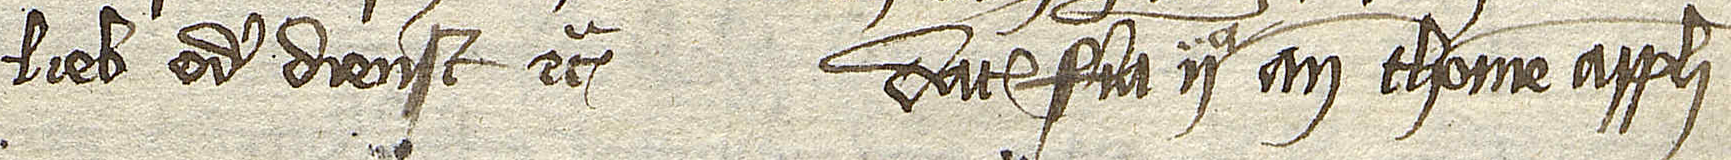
lieb od* dienſt ec* Dat* fi*a ii* an* thome* appli*
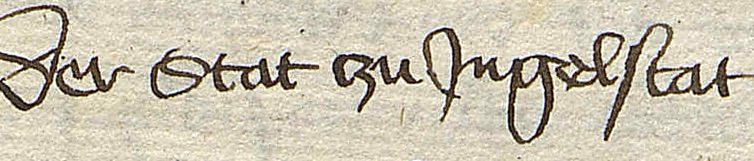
Der Stat cʒu Ingelſtat
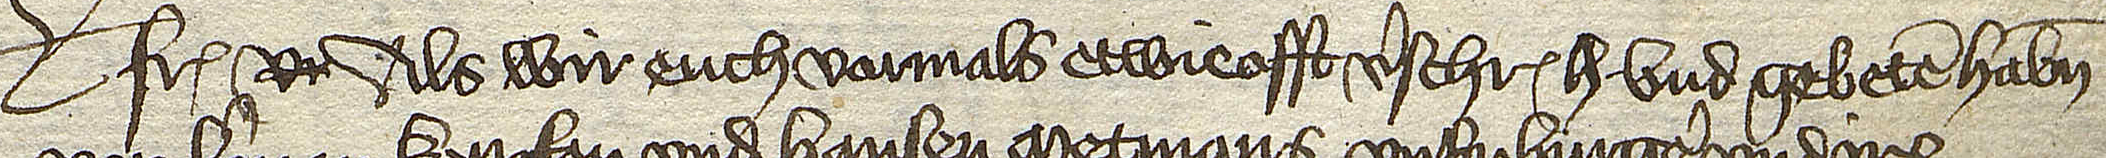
L* fr* vn Als wir euch vormals etwieofft v*ſchr* h vnd gebete* habn*
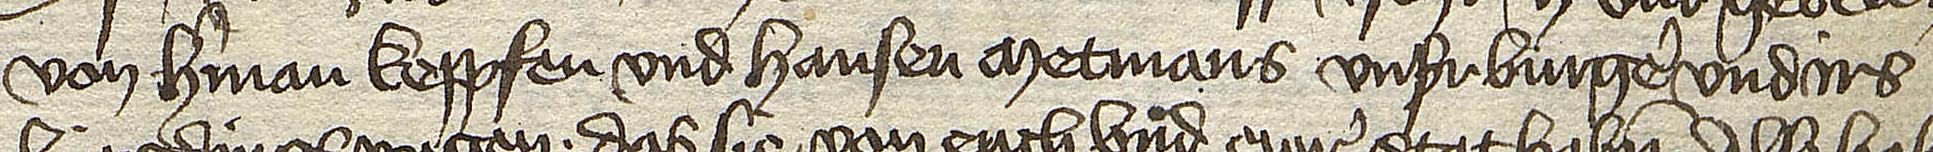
von h*man keppfen vnd hanſen Metmans vnſ*r burge* vnd irs
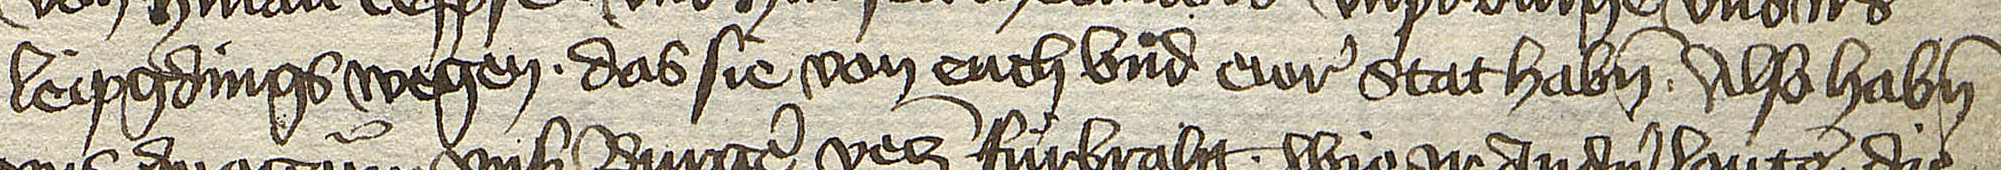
leipgdings wegen . das ſie von euch vnd ewr* Stat habn* . Alſo habn*
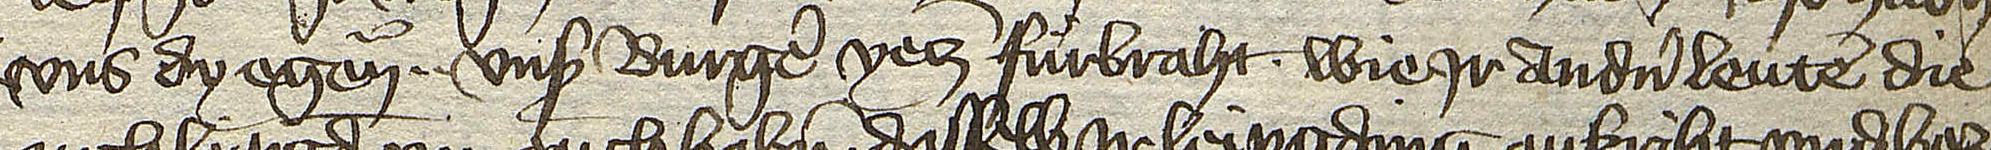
vnd dy egen* ~ vnſ* Burge* yecʒ* fürbraht . wir Ir Andn* leute* die
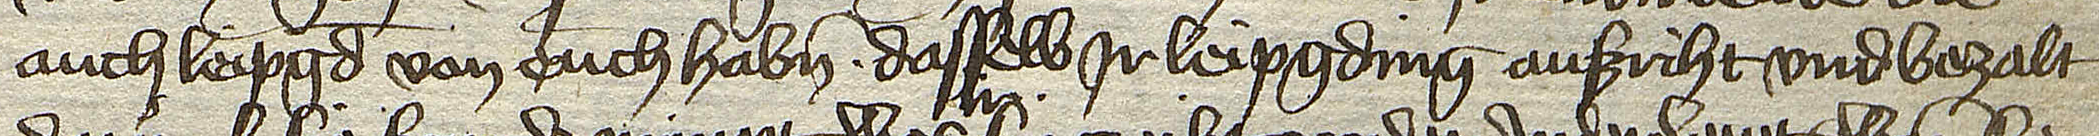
auch leipgd* von euch habn* . doſſelb Ir leipgding auſʒriht vnd becʒalt
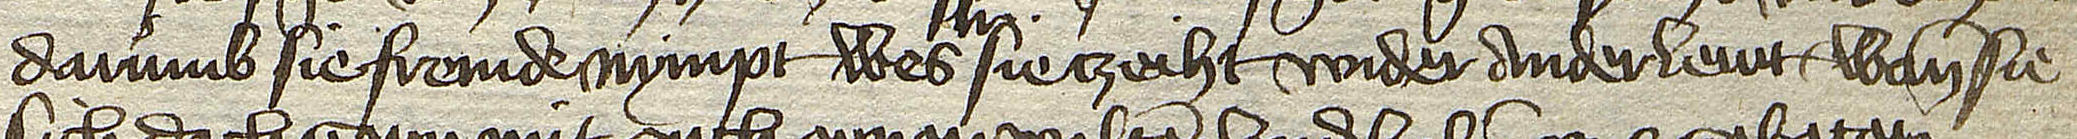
darümb ſie fremde nympt wes ſie cʒeiht wider Anderlewt / wan* ſie
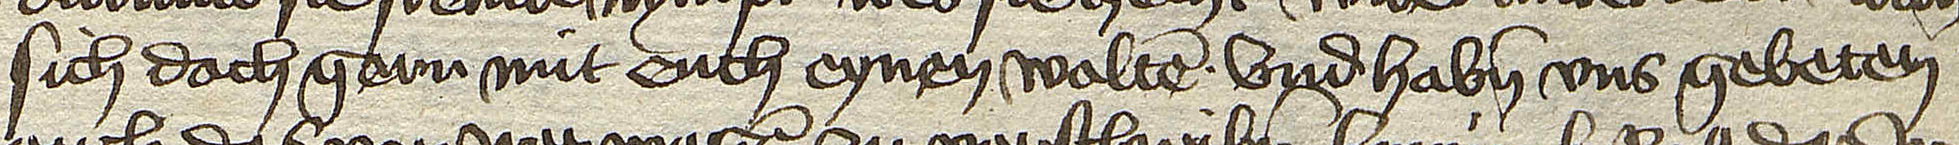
ſich doch gern mit euch eynen wolte* . vnd habn* vns gebeten
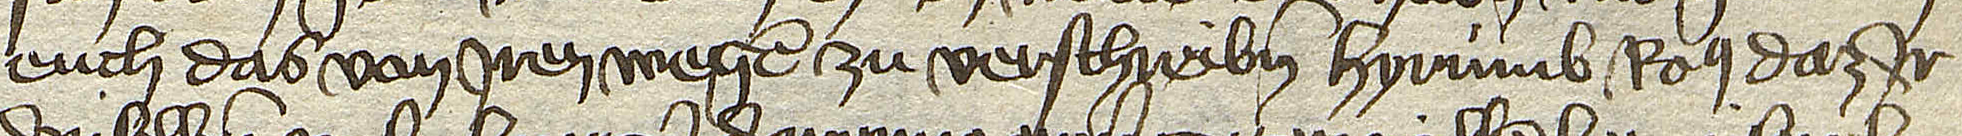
euch das von Iren wege* cʒu verſchreibn* hyrümb Ro* daʒ Ir
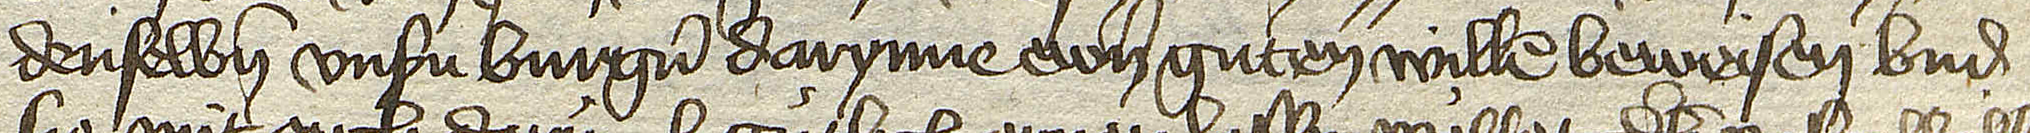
denſelbn* vnſ*n burgn* darynne ewn* guten wille* beweiſen vnd
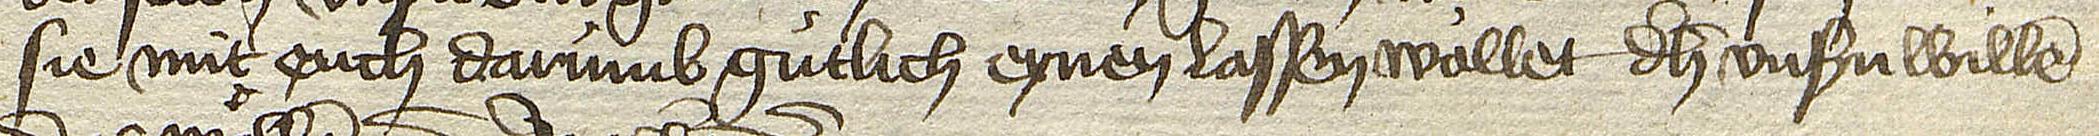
ſie mit euch darümb gütlich eynen laſſen wöllet d*h vnſ*n wille*
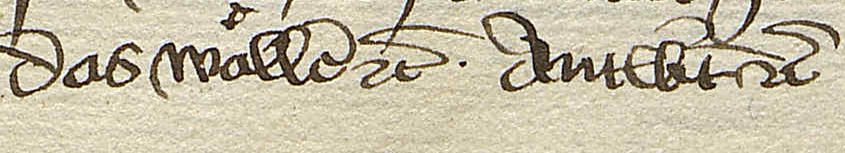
Das wölle* ec* . Antw*t ec*
